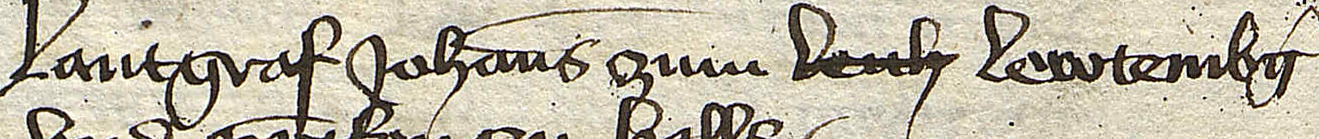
Lantgraf Iohan*s cʒum Leuh Lewtemb*g
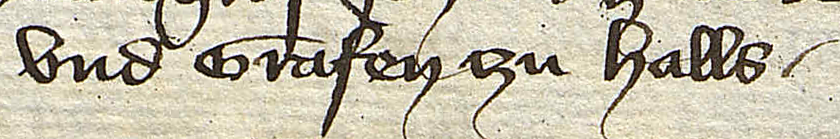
vnd Grafen cʒu halls /
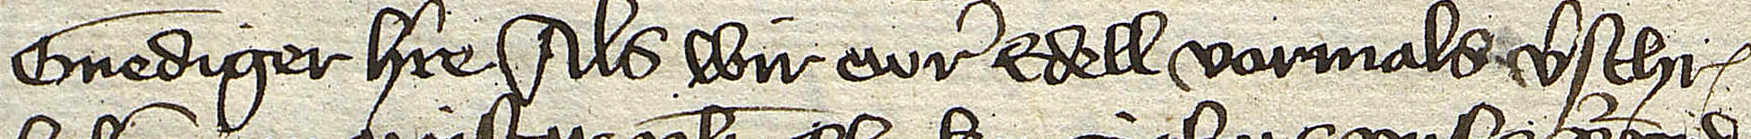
Gnediger h*re Als wir ewr* Edell vormals v*ſchr*
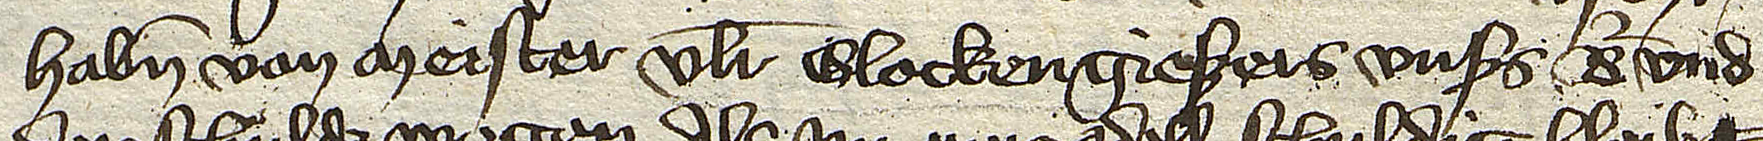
habn* von Meiſter vlr* Glockengieſʒers vnſ*s B* vnd
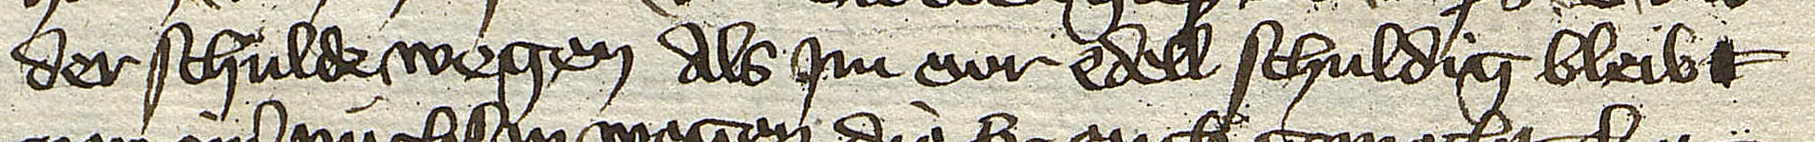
der ſchulde wegen Als Im ewr edell ſchuldig bleibt
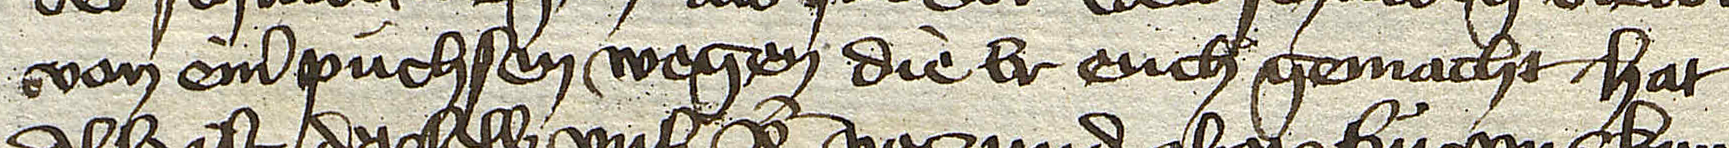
von ein* püchſen wegen die Er euch gemacht / hat
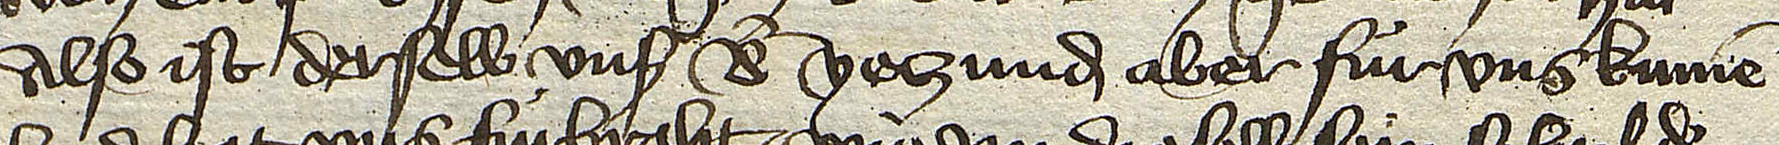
Alſo iſt derſelb vnſ* B* yecʒund* aber für vns kume*
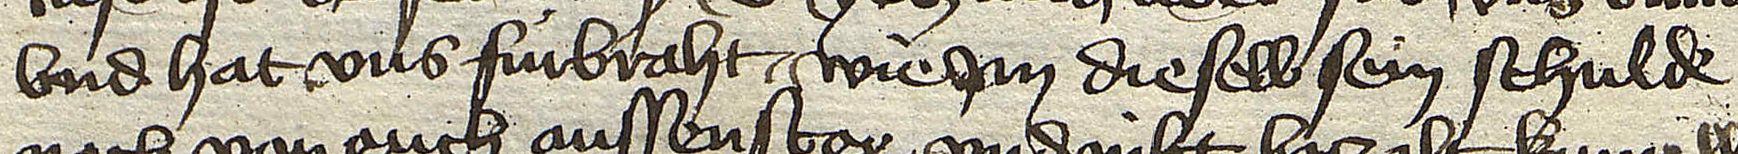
vnd hat vns fürbraht / wie Im dieſelb ſein ſchulde
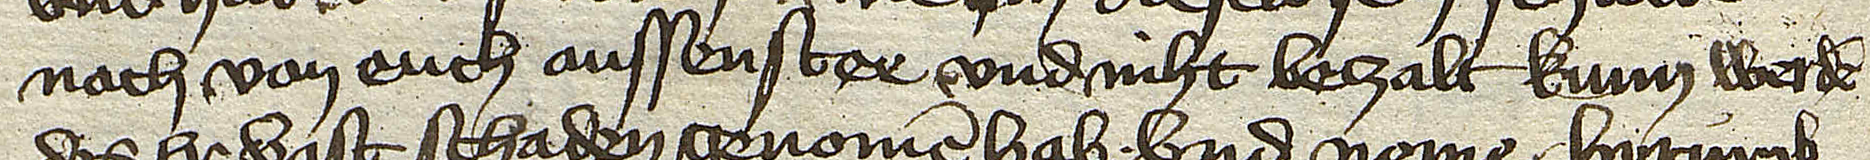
noch von euch auſſenſtee vnd niht becʒalt kunn werde*
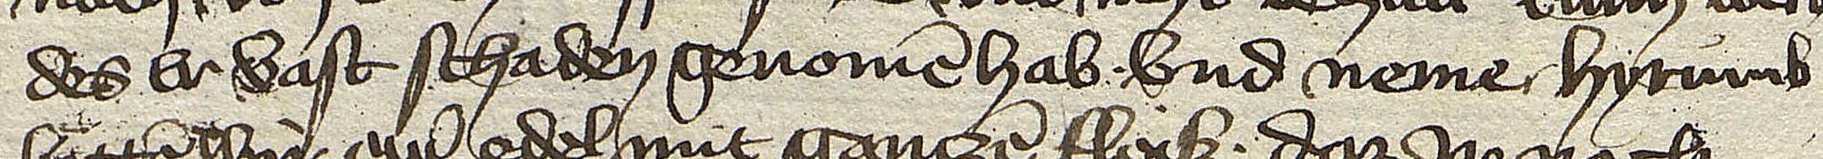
des Er vaſt ſchaden genome* hab . vnd neme / hyrümb
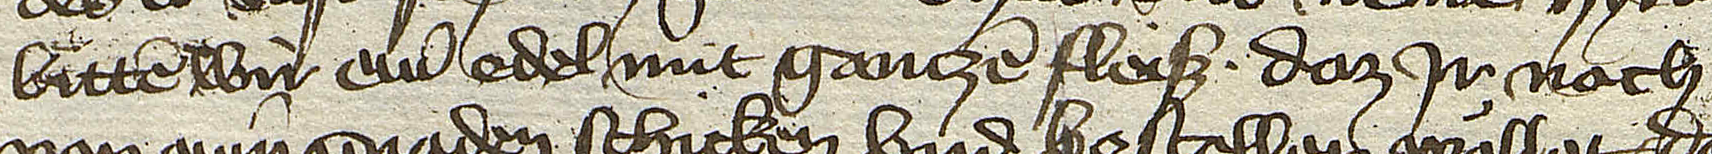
bitte* wir ew* edel mit gancʒe* fleiſʒ . daʒ Ir noch
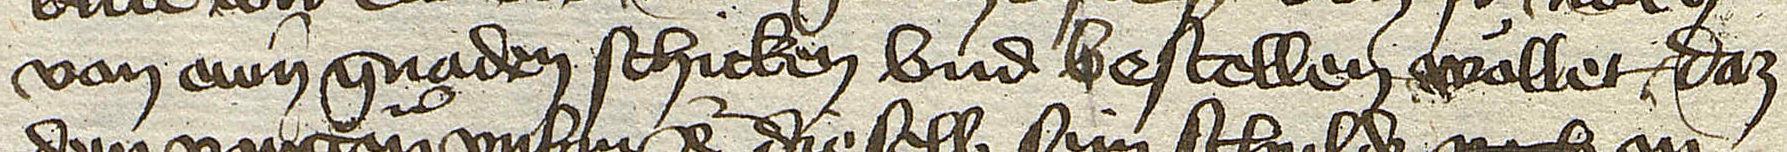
von ew*n gnaden ſchicken vnd beſtellen wöllet / daʒ
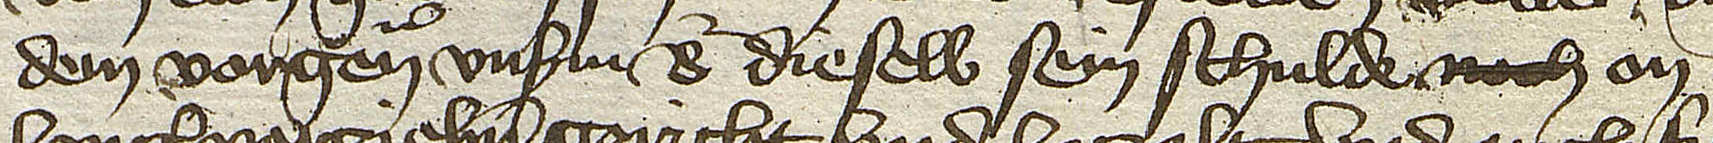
dem vorgen* vnſ*m B* dieſelb ſein ſchulde noch on
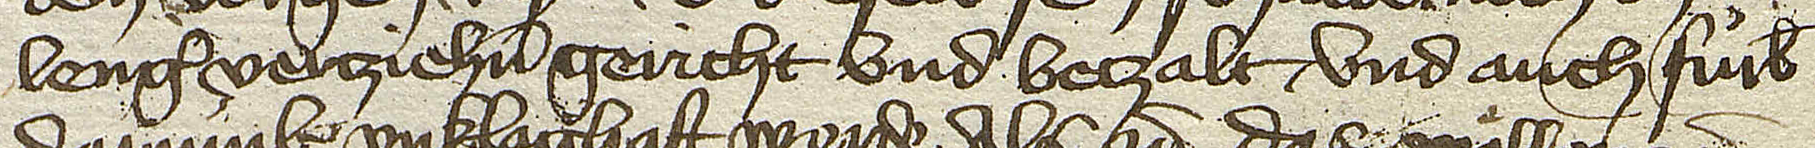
leng* vercʒiehn* gericht vnd becʒalt / vnd auch fürb*
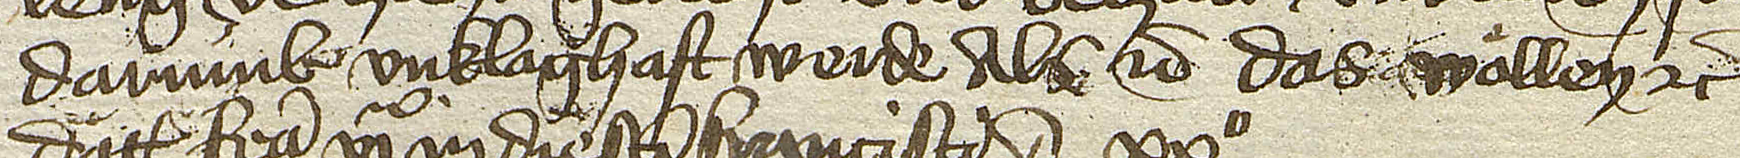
darümb vnklaghaft werde Als ec* Das wöllen ec*
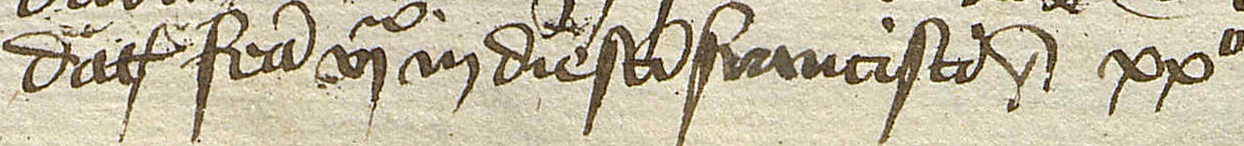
Dat* fea* vi* in die ſci* franciſci A xx*
